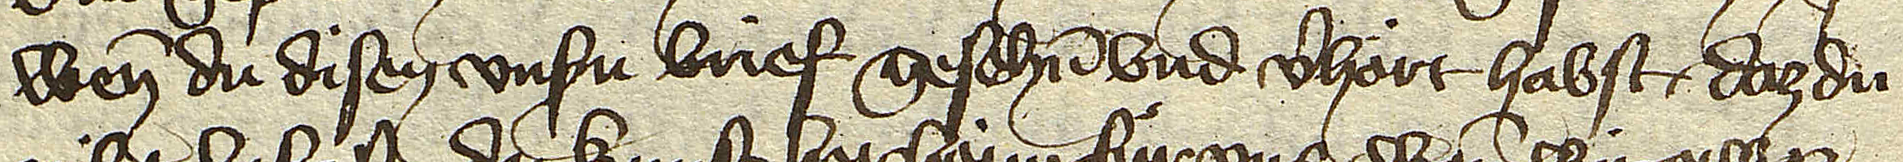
wen* du diſen vnſ*n brief geſehn* vnd v*hört habſt / daʒ du
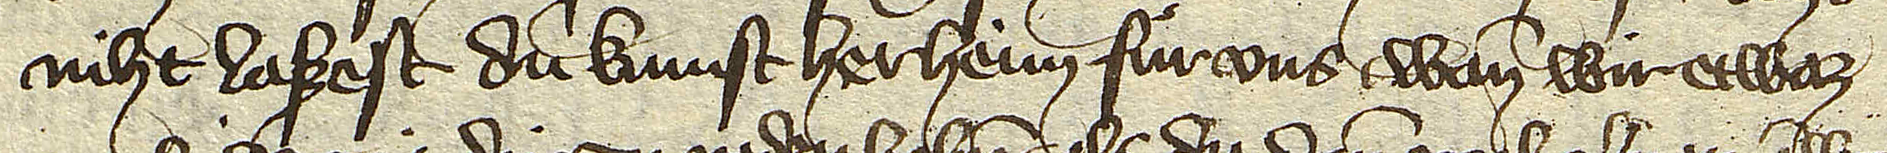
niht laſʒeſt du kumſt herheim für vns / wan* wir etwaʒ
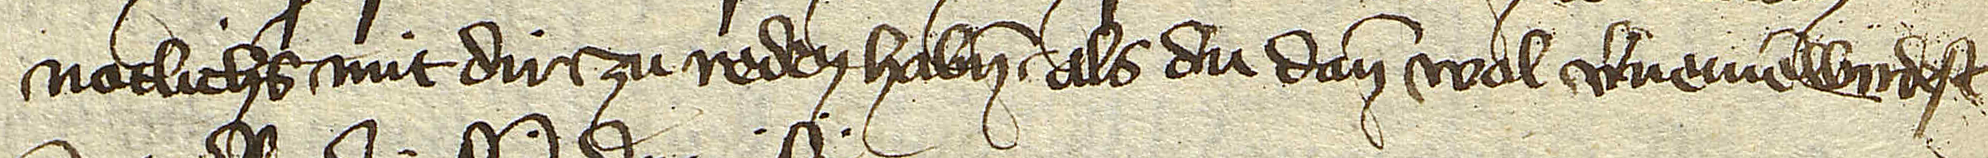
notlichs mit dir cʒu reden habn* / als du dan* wol v*neme* wirdeſt
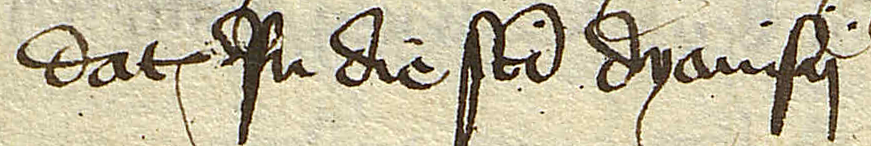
dat* In die ſci* dyoniſii
